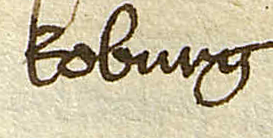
koburg
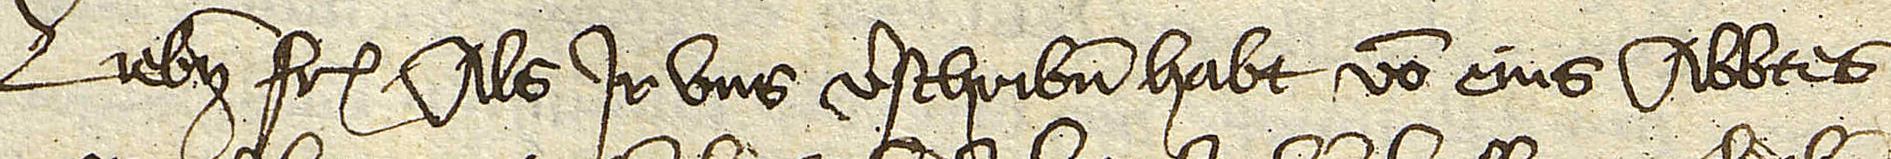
Liebn* fr* / Als Ir vns v*ſchribn* habt vo* eins Abbtes
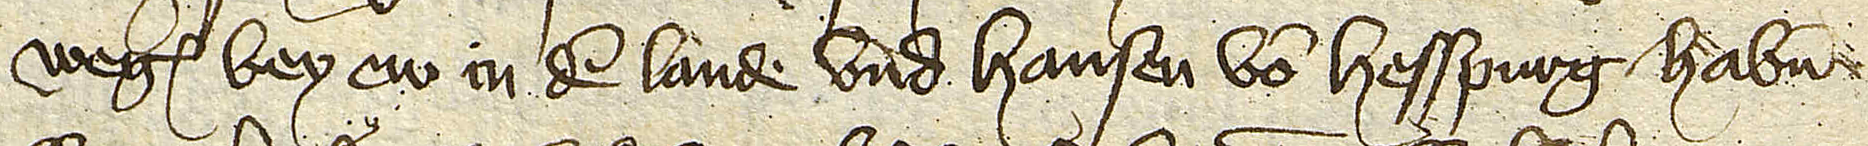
weg* bey ew in d* lande vnd hanſen vo* heſſpurg / habn*
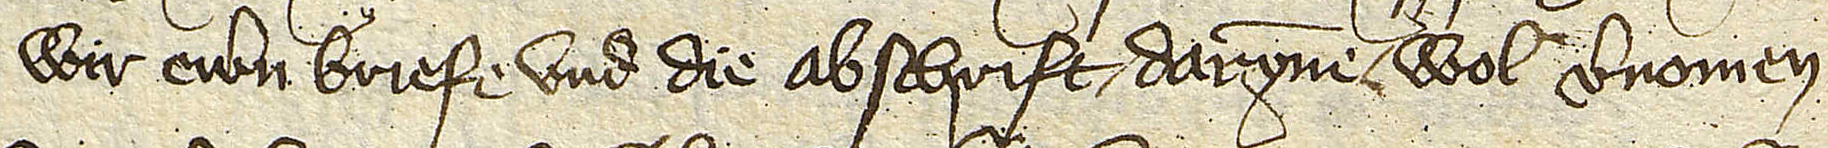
wir ew*n briefe vnd die abſchrift / daryne* / wol v*nomen
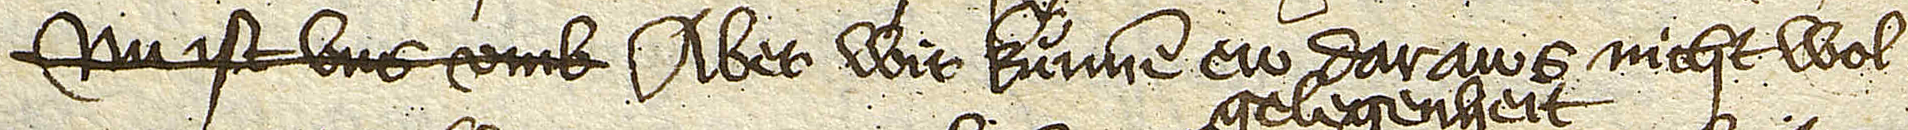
Nu iſt vns vmb Aber wir künne* ew daraws nicht wol
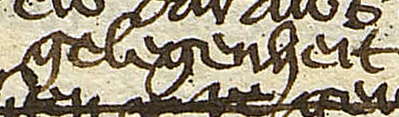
gelegenheit
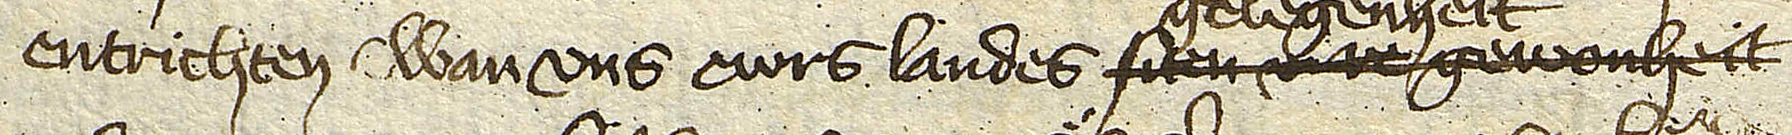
entrichten / wan vns ewrs landes ſiten v re gewonheit
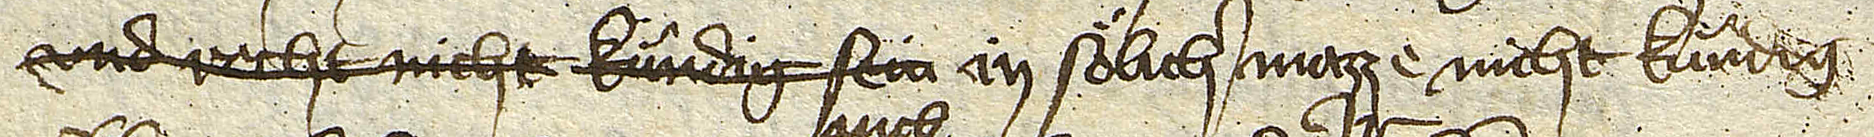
vnd recht nicht kündig ſein in ſölich* maʒʒe nicht kündig
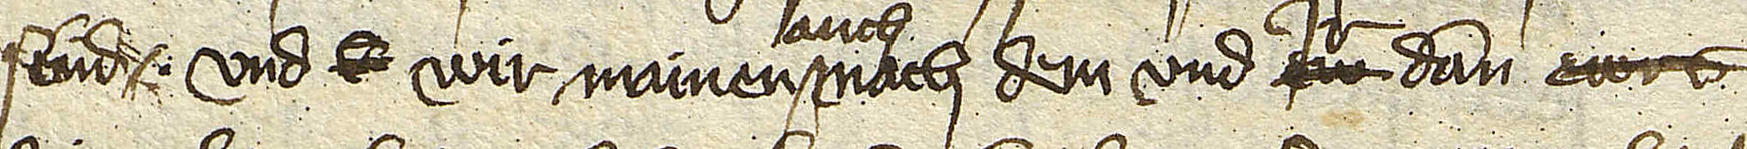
ſind / . vnd % wir mainen nach dem vnd ew dan* ewrs
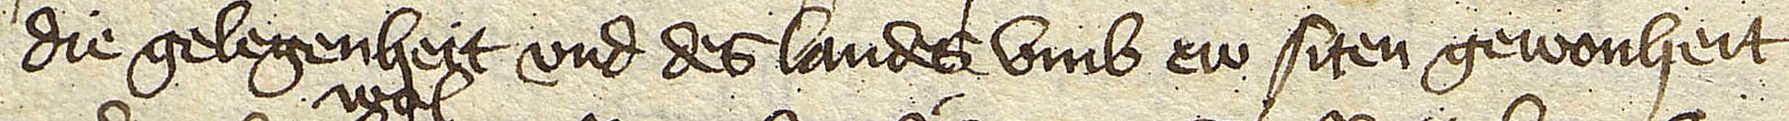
die gelegenheit vnd des landes vmb ew ſiten gewonheit
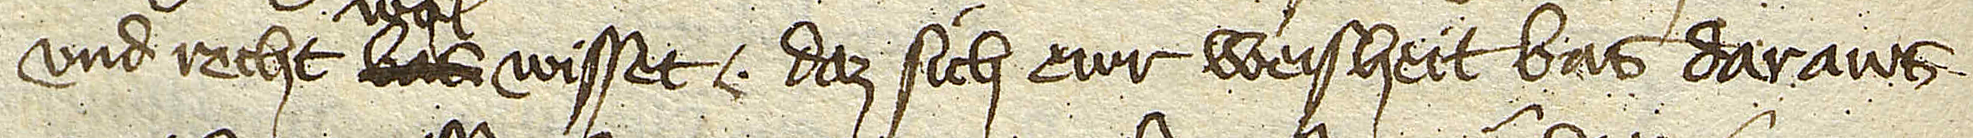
vnd recht bas wiſſet / . daʒ ſich ewr weiſheit bas daraws
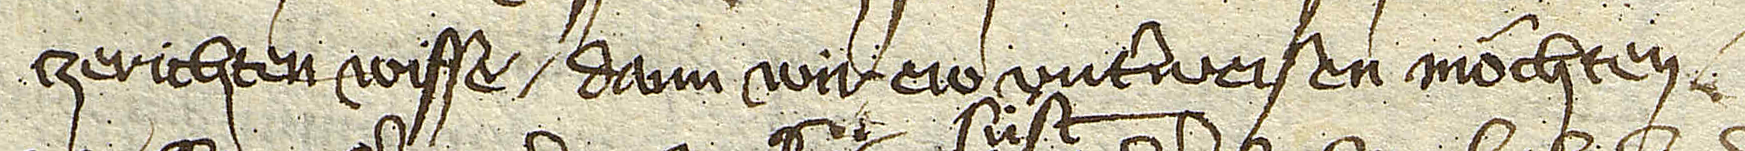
cʒerichten wiſſe* / dann wir ew vnt*weiſen möchten /
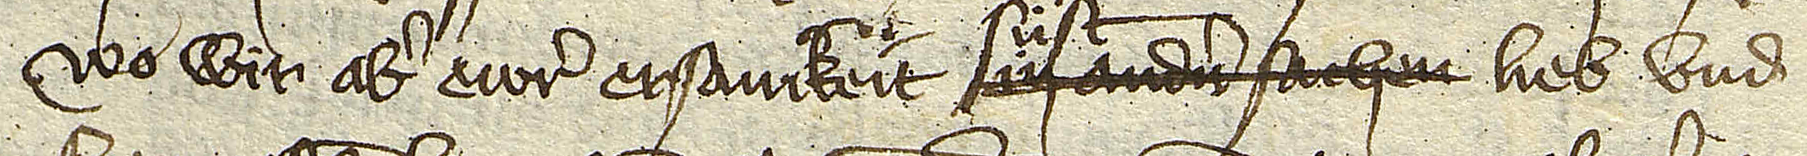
wo wir ab* ewr* erſamkeit in andn* ſachen lieb vnd
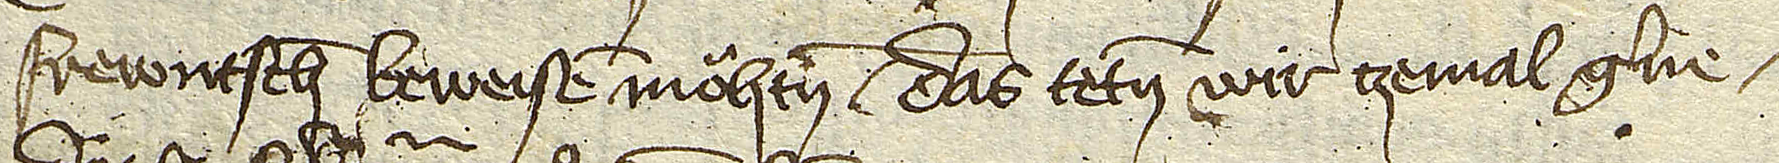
frewntſch* beweiſe* möhtn* / Das tetn* wir cʒemal g*ne /
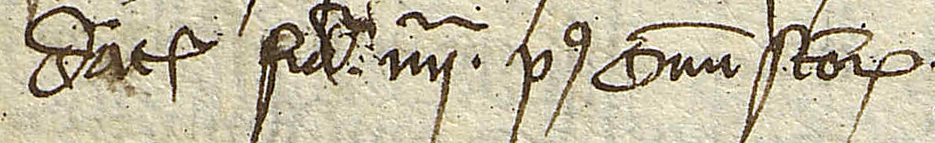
Dat* fia* . iiii* . p* Omi* ſco*
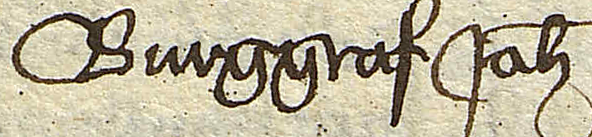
Burggraf Ioh*
